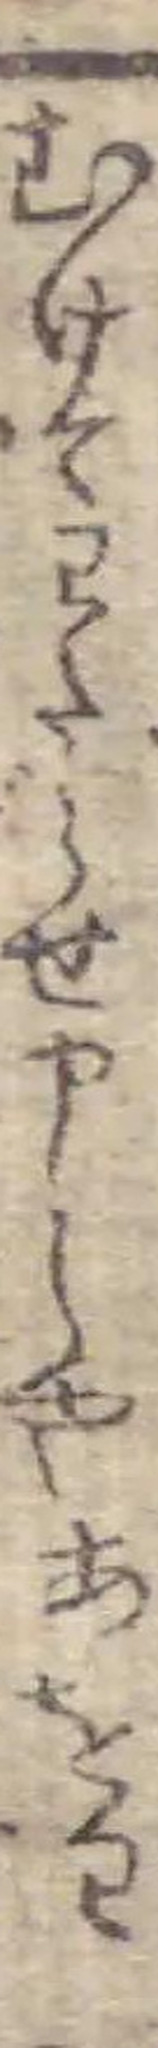むけてわたらせ申しや海をわ
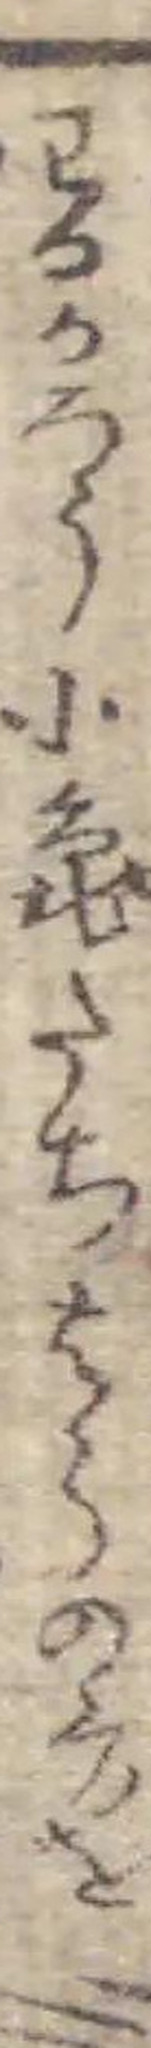わるかろう小亀たちはらの方を
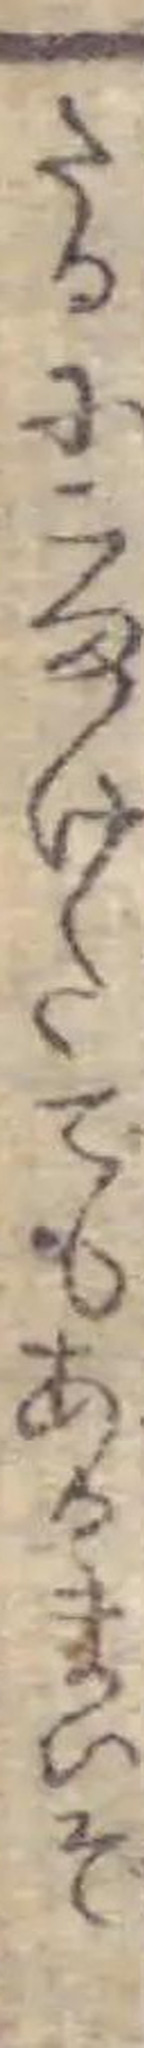たるにこまげたでもあるまいぞ

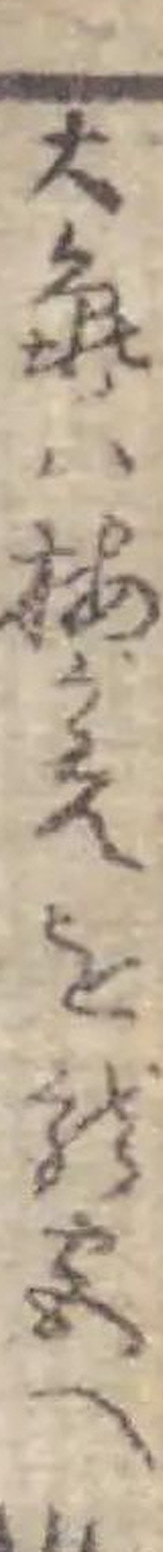大亀は梅かえを龍宮へ
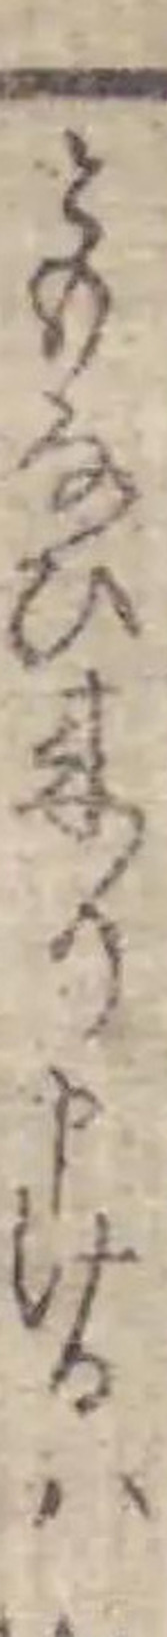ともなひ来り申けるは
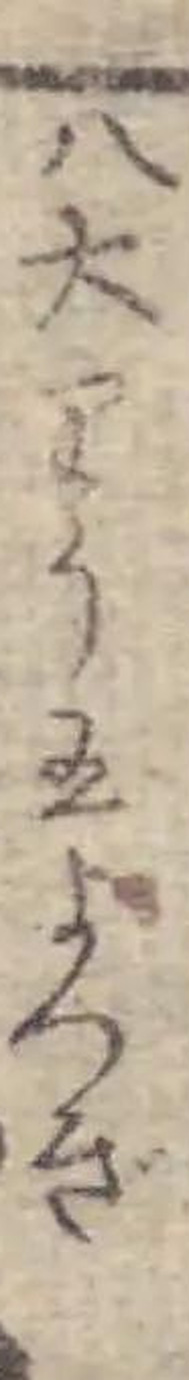八大りう王よつぎ
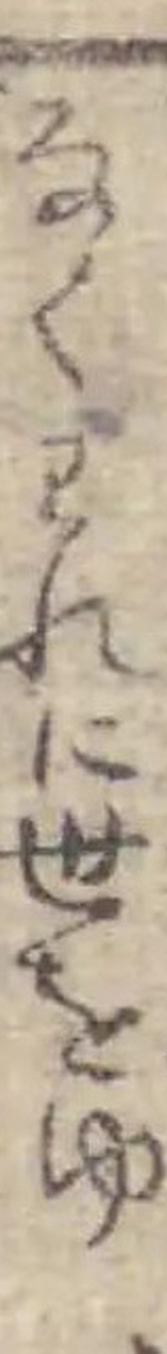なくわれに世をゆ
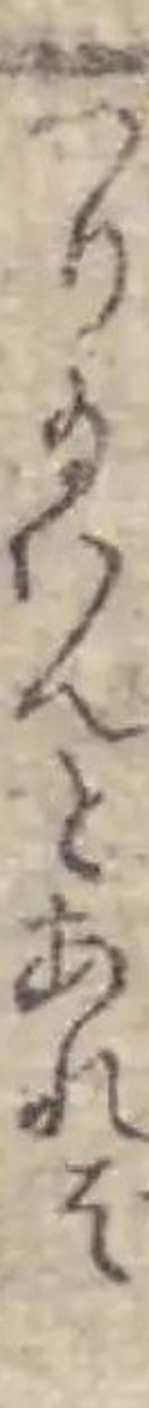つり給はんとあれば
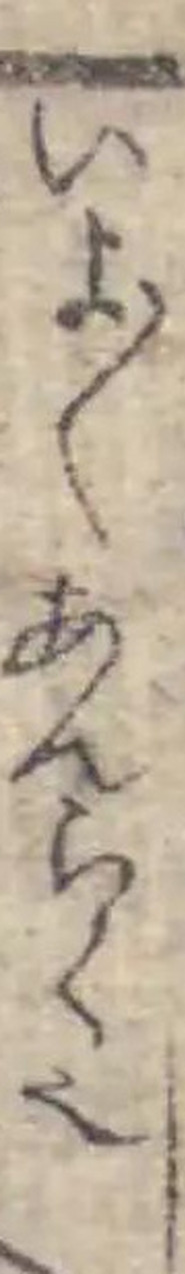いよ〳〵あんらく也
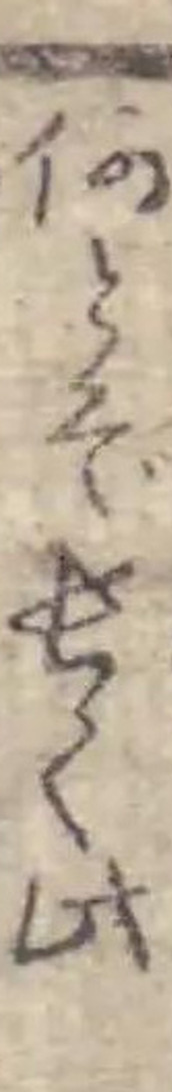何とぞ長く此
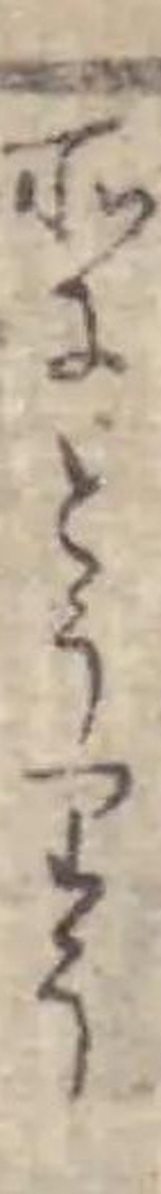所にとうりう
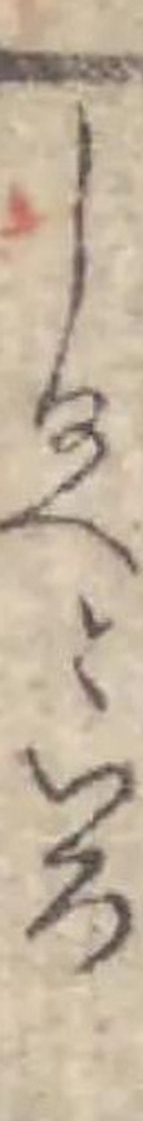し給へといろ
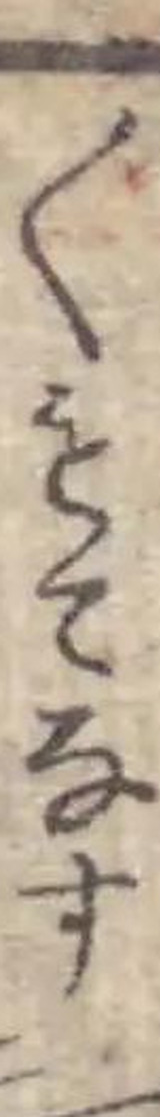〳〵もてなす
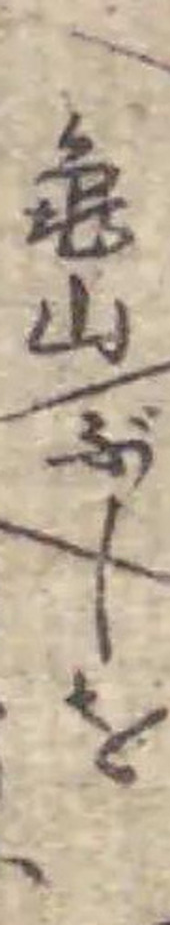亀山ぶしを
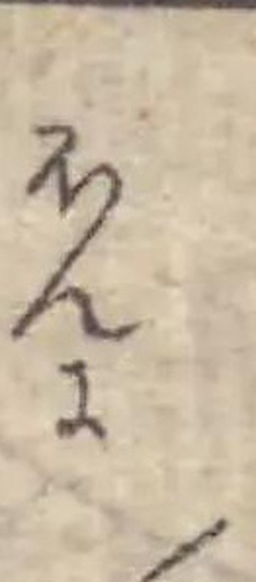ほんに
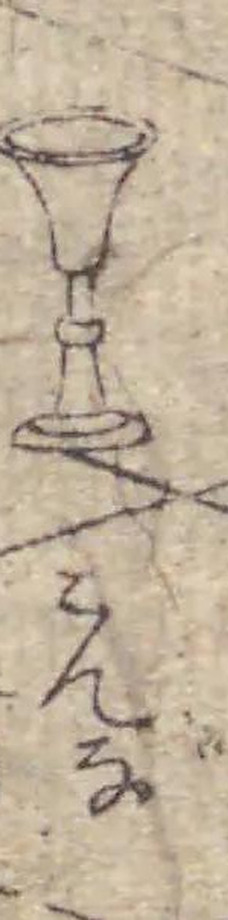こんな
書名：見立蓬莱 : 2巻
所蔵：国立国会図書館 National Diet Library, JAPAN
